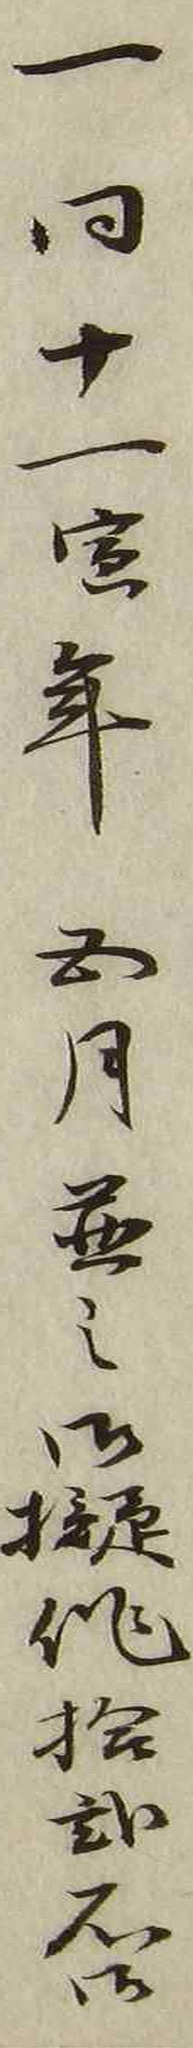一同十一寅年五月並之御擬作拾弐石御
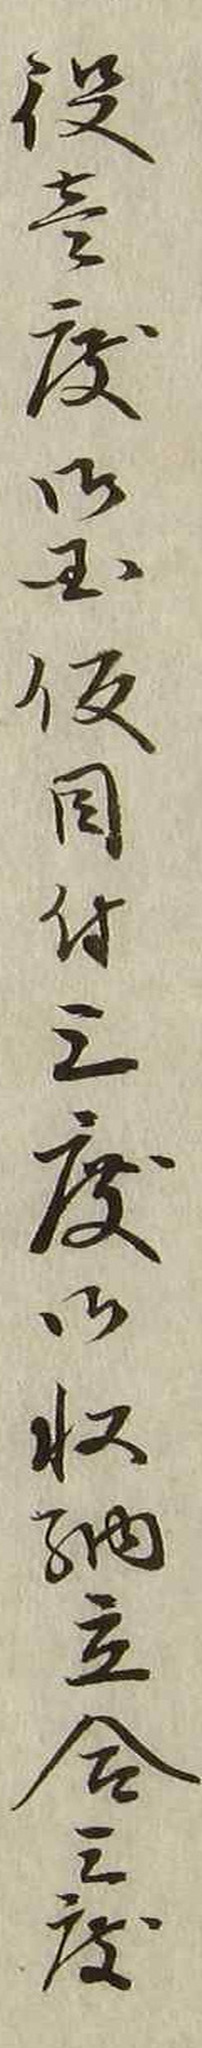役壱度御国仮目付三度御収納立ち合い三度
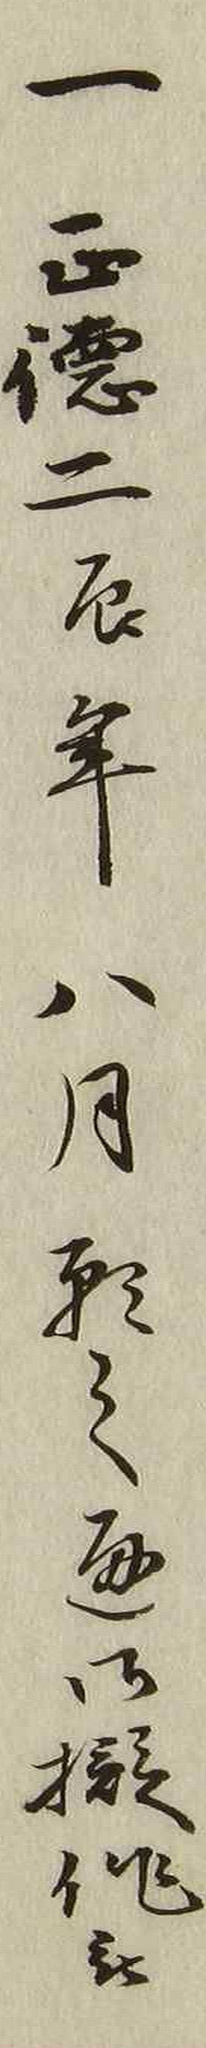一正徳二辰年八月願い之通り御擬作
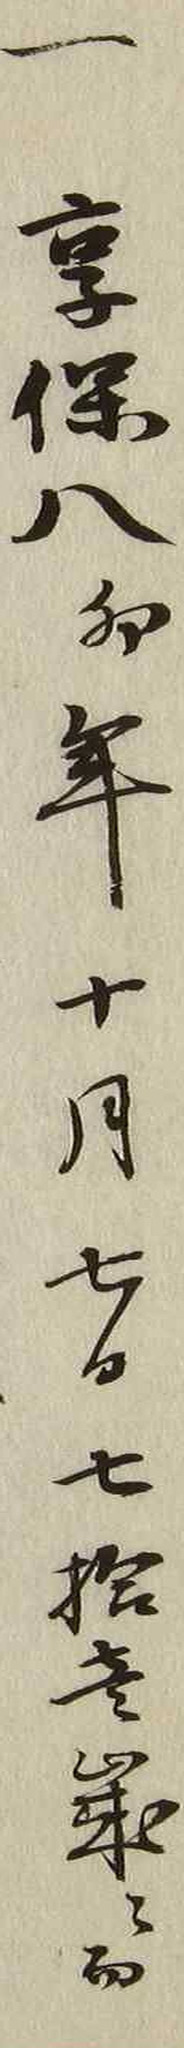一享保八卯年十月七日七拾壱歳ニて
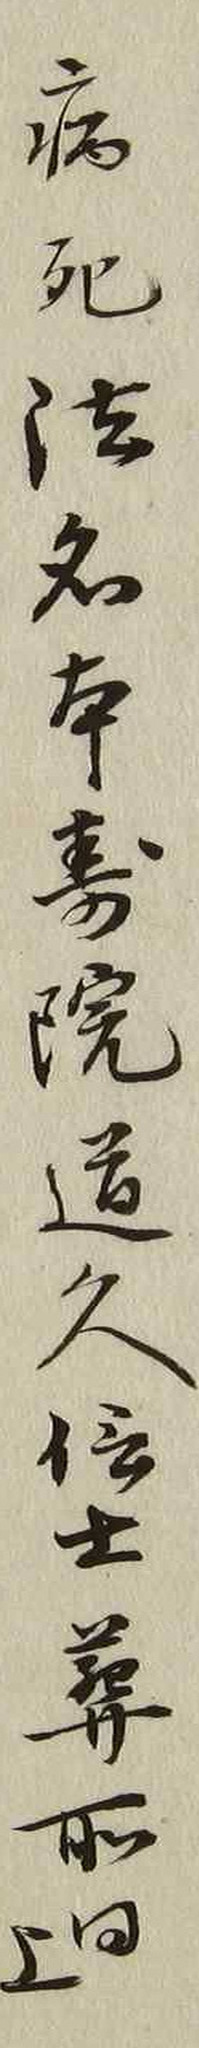病死法名本寿院道久信士葬処同上
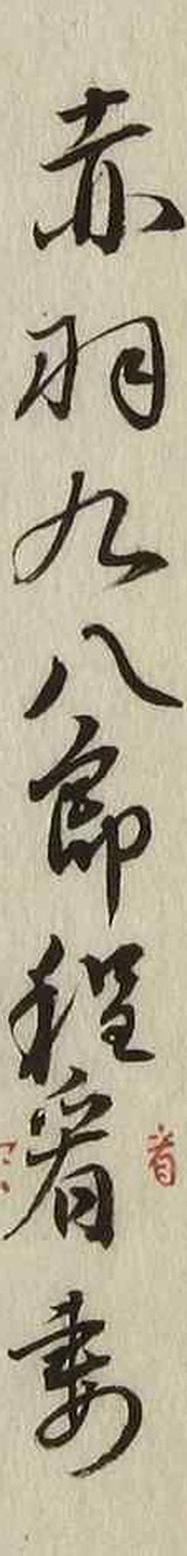女赤羽九八郎程看妻
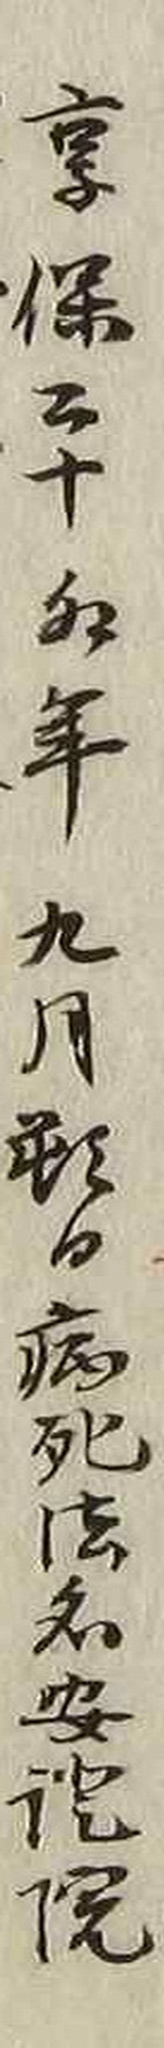享保二十卯年九月朔日病死法名安證院
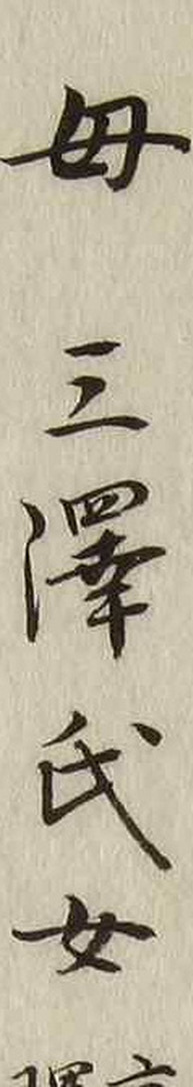母三澤氏女
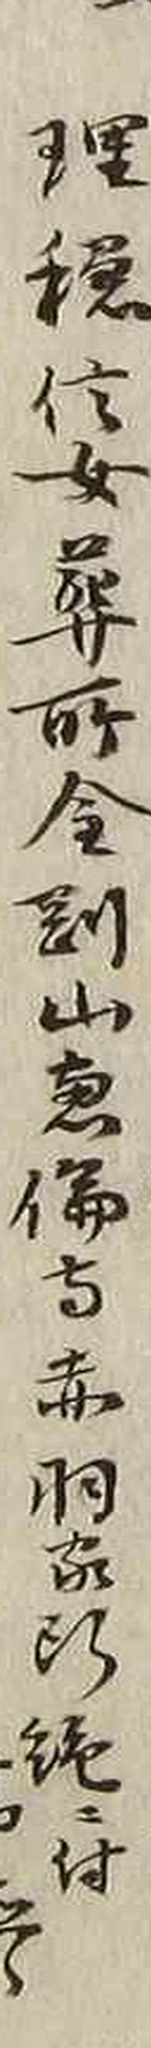理穏信女葬所金剛山恵倫寺赤羽家断絶ニ付き書置候
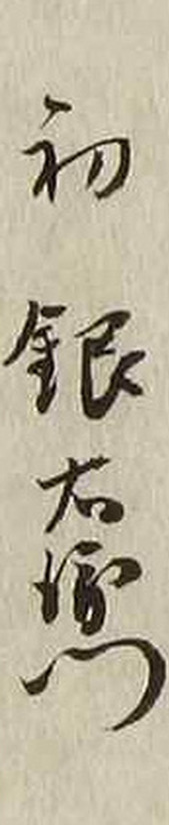初銀右衛門
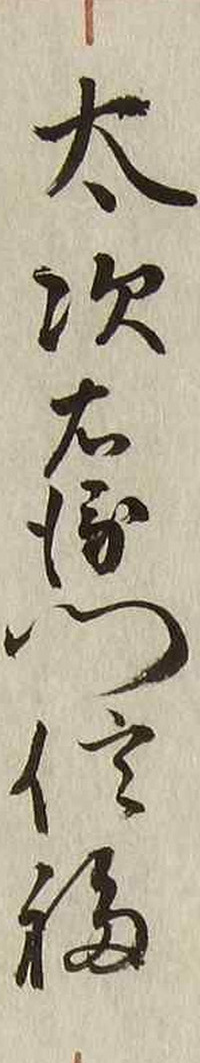太次右衛門信福
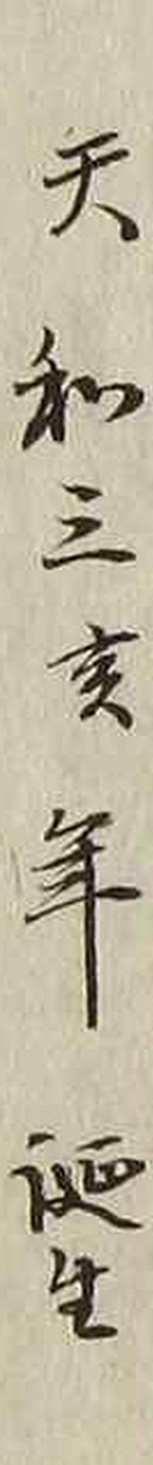天和三寅年誕生
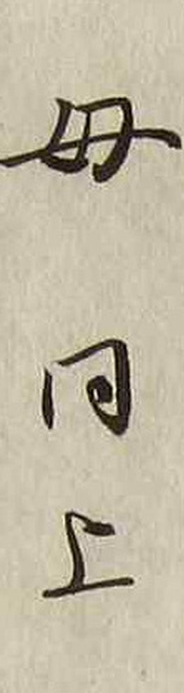母同上

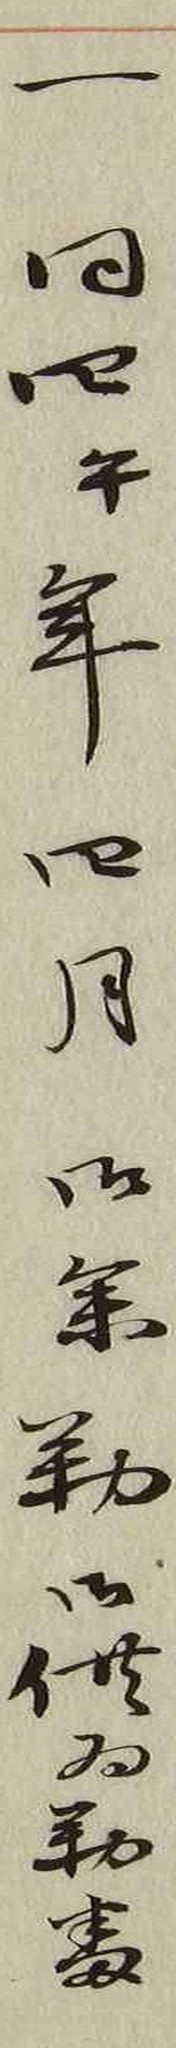一同四午年四月御参勤御供勤番之為
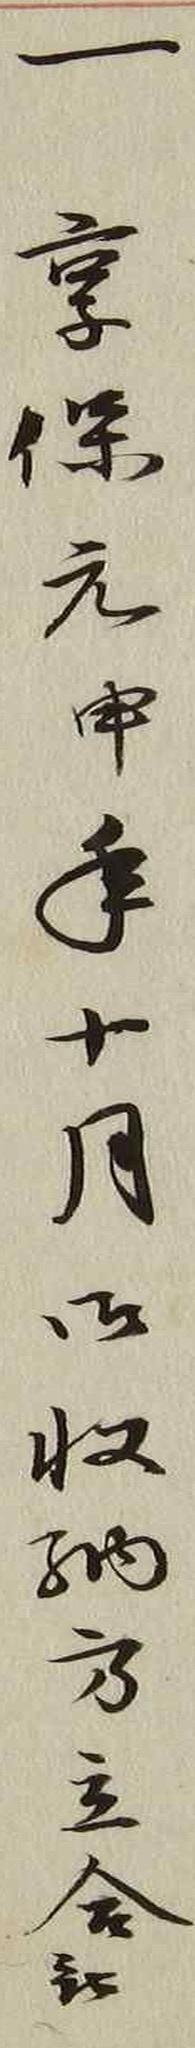一享保元申年十月御収納方立会
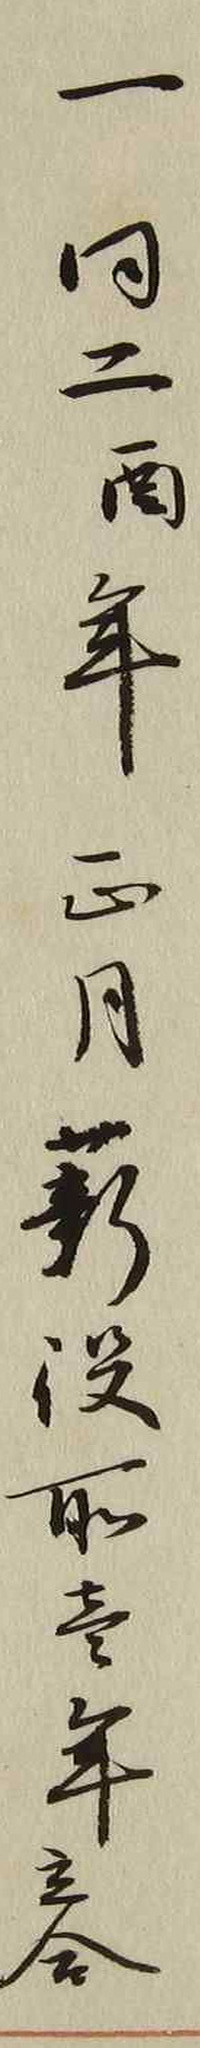一同二酉年正月薪役所壱年立会
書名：諸士系譜　巻之16　い之部16
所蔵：会津若松市立会津図書館
